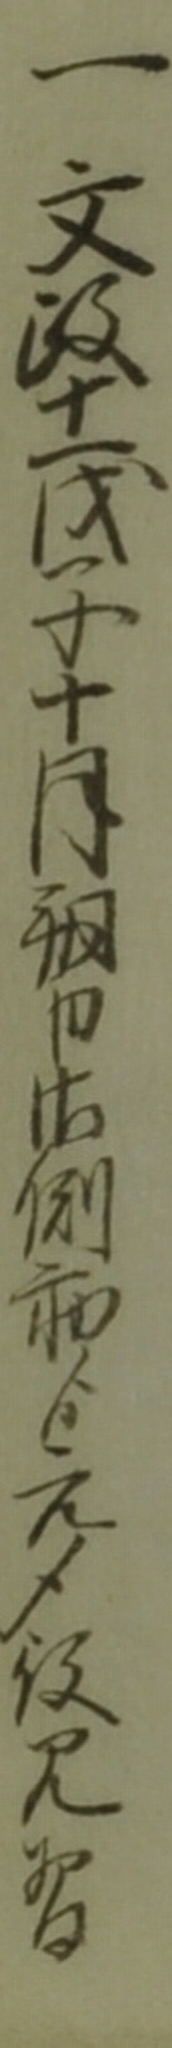一文政十一戊子十月朔日御側勤ゟ元〆役見習
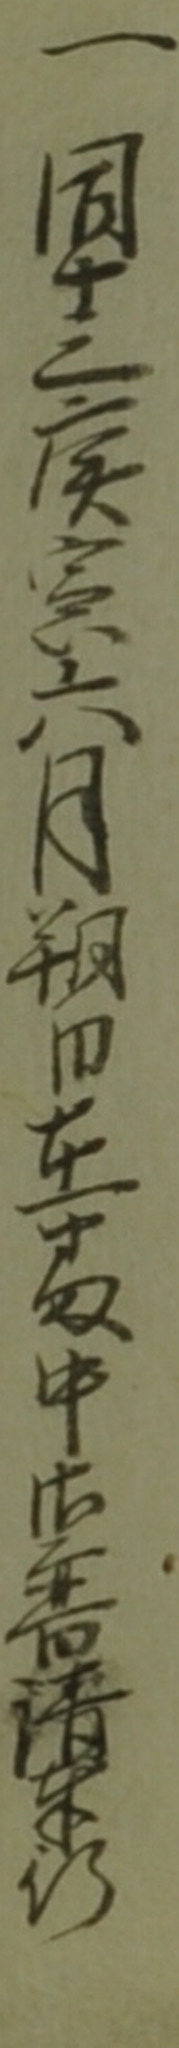一同十二庚寅六月朔日在両中御普請奉行
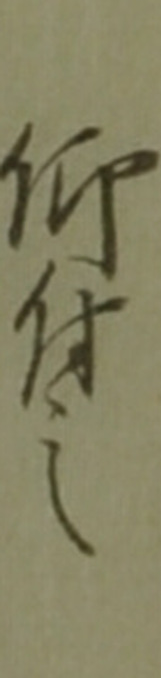仰付之
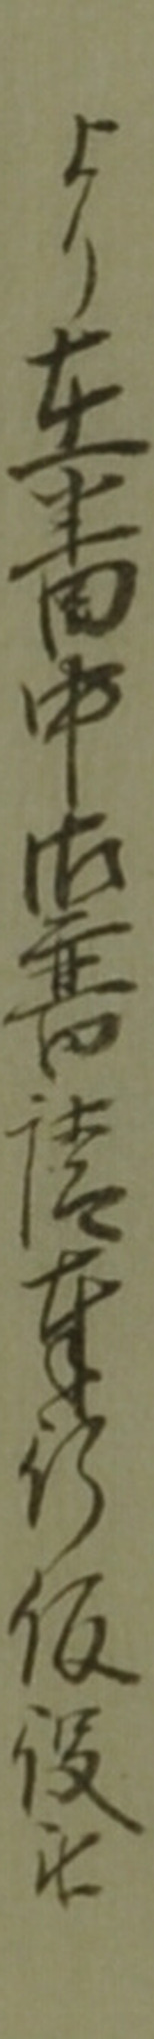より在番中御普請奉行仮役被
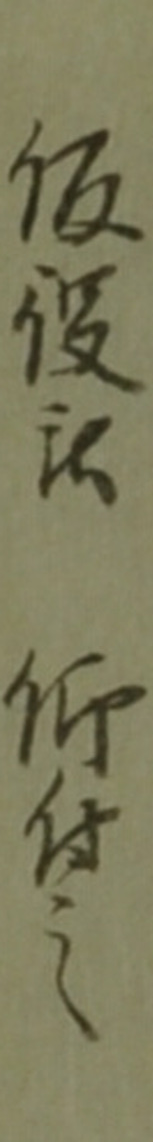仮役被仰付之
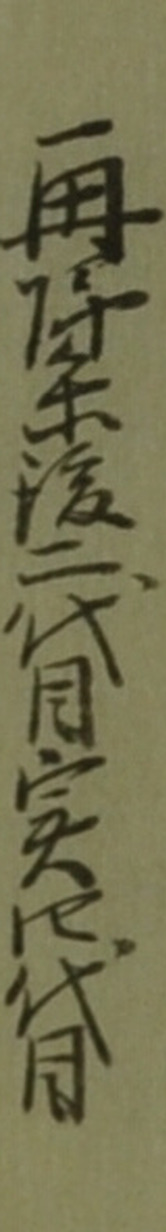再帰参後二代目実四代目
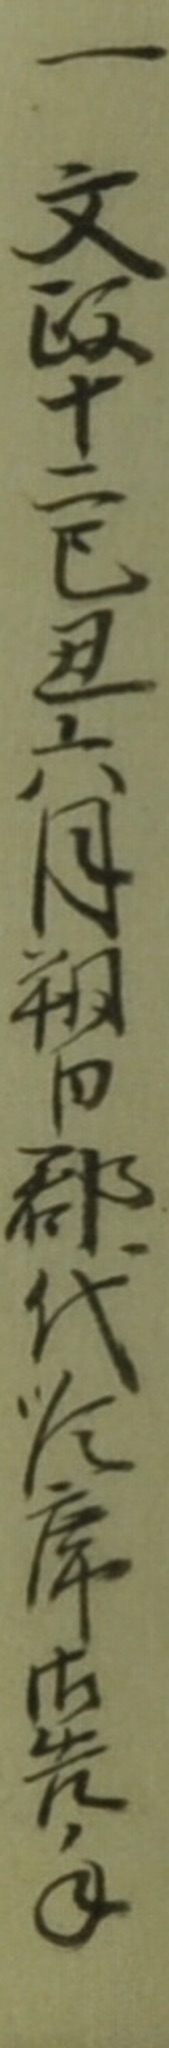一文政十二己丑六月朔日郡代次席御先手
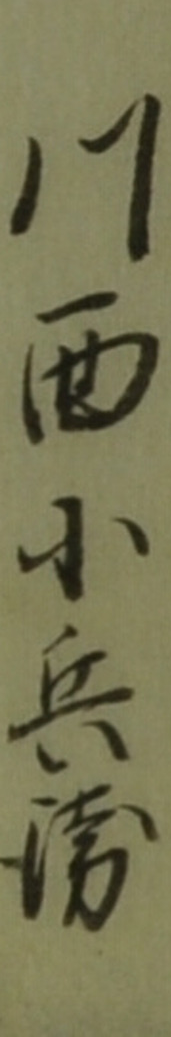川面小兵衛

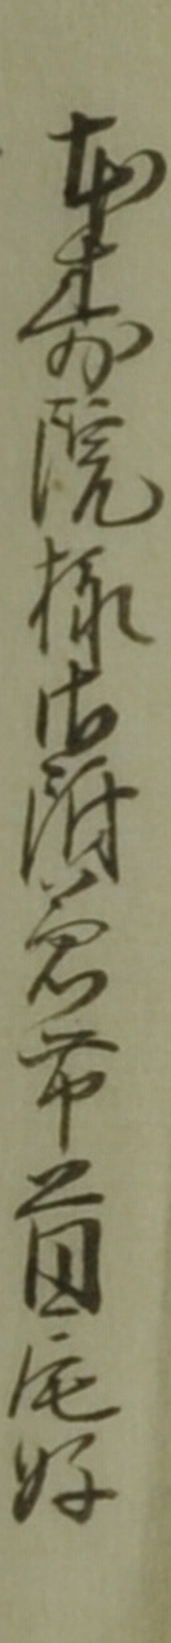本寿院様御附兼帯首尾好
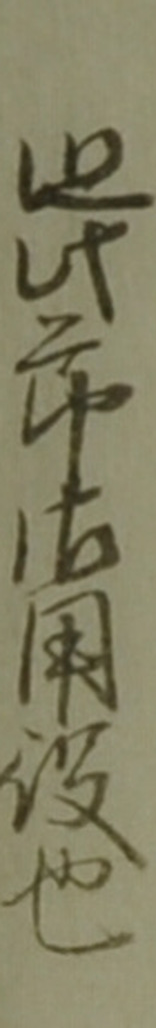但此節御用役也
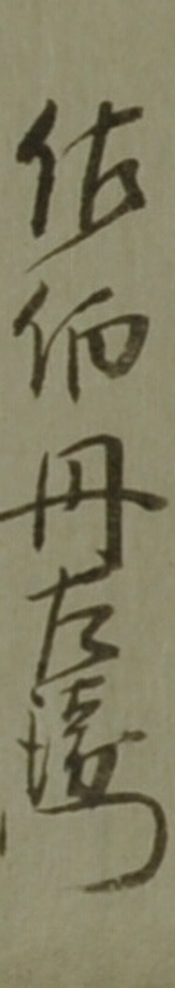佐伯丹左衛門
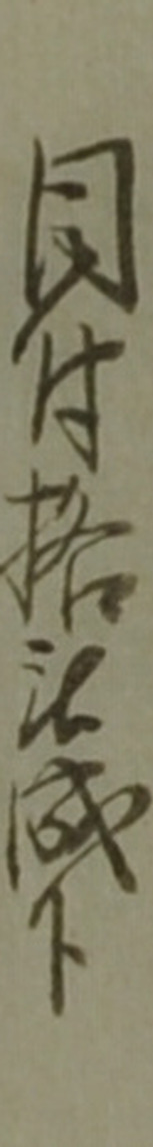目付格被成下
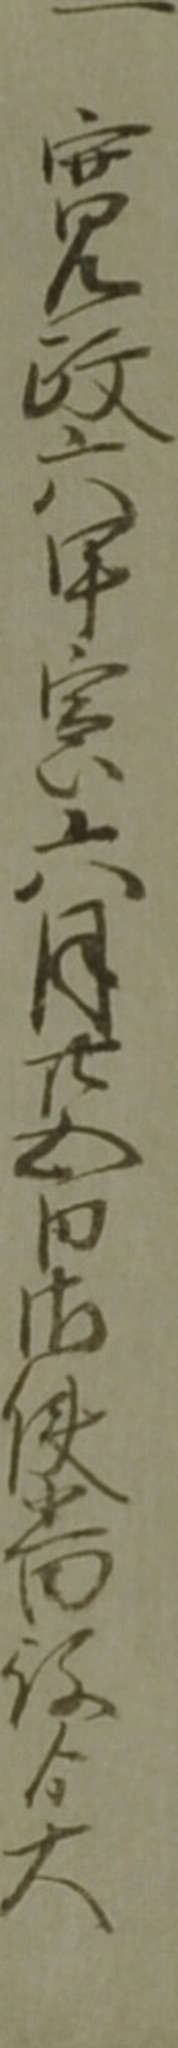一寛政六甲寅六月廿五日御使番役ゟ大
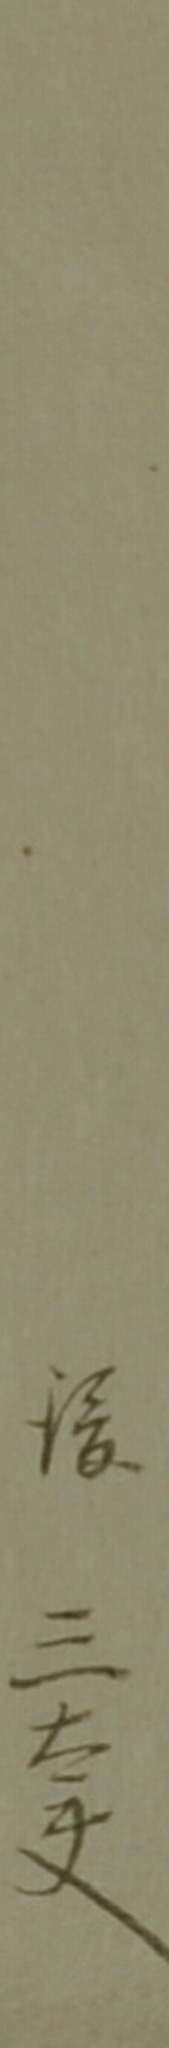後三太夫
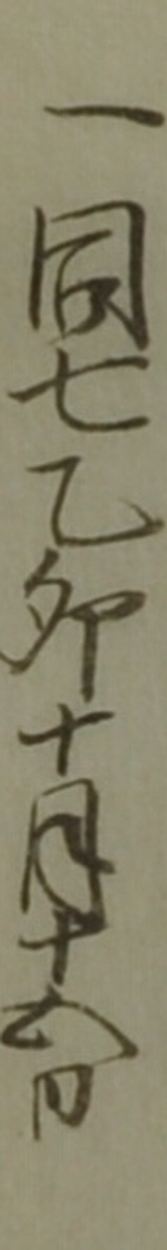一同七乙卯十月十五日
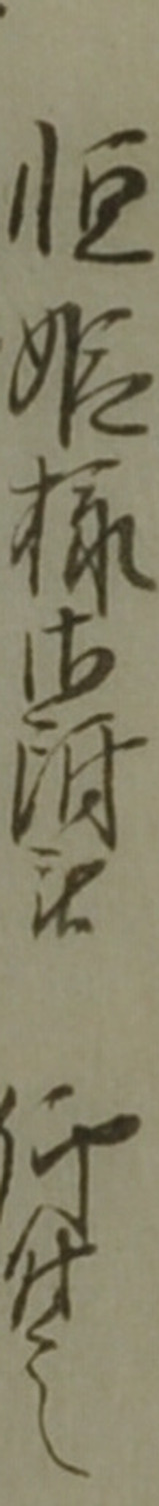恒姫様御附被仰付之
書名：諸御役代々録（六）
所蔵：伊那市立高遠町図書館・合同会社AMANE
